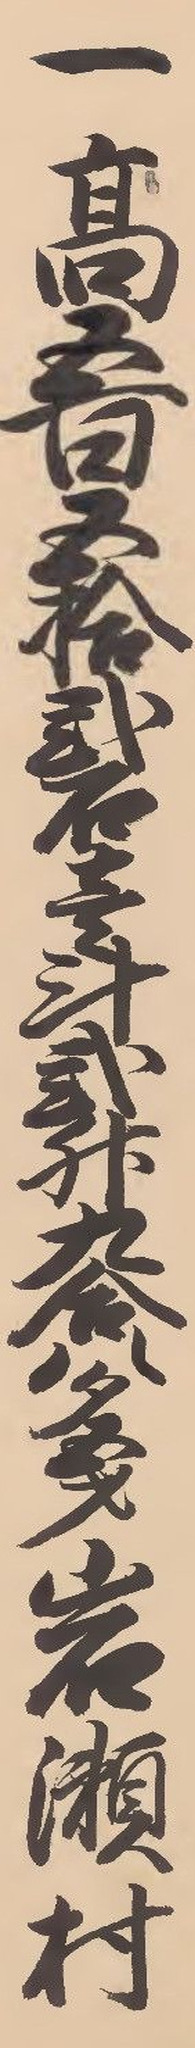一高五百五拾弐石壱斗弐升九合八勺五才岩瀬村
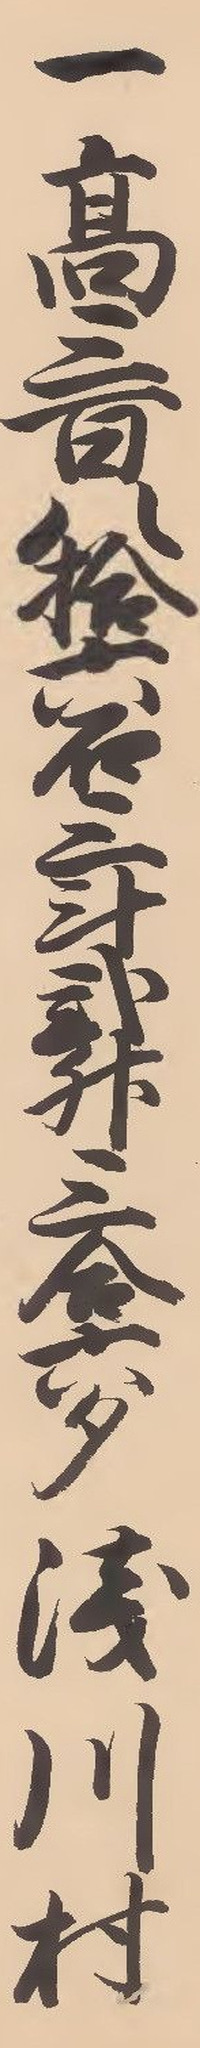一高三百八拾六石三斗弐升三合六勺浅川村
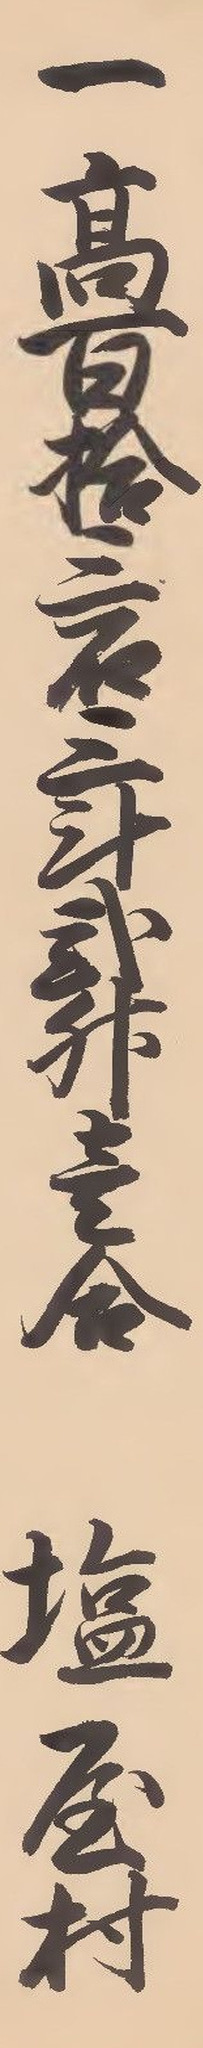一高百拾三石三斗弐升壱合塩屋村
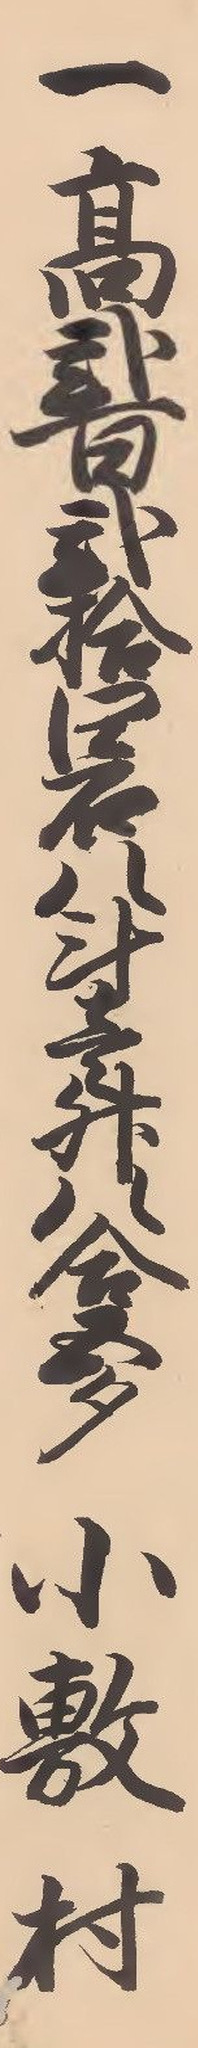一高弐百弐拾四石八斗壱升八合五勺小敷村

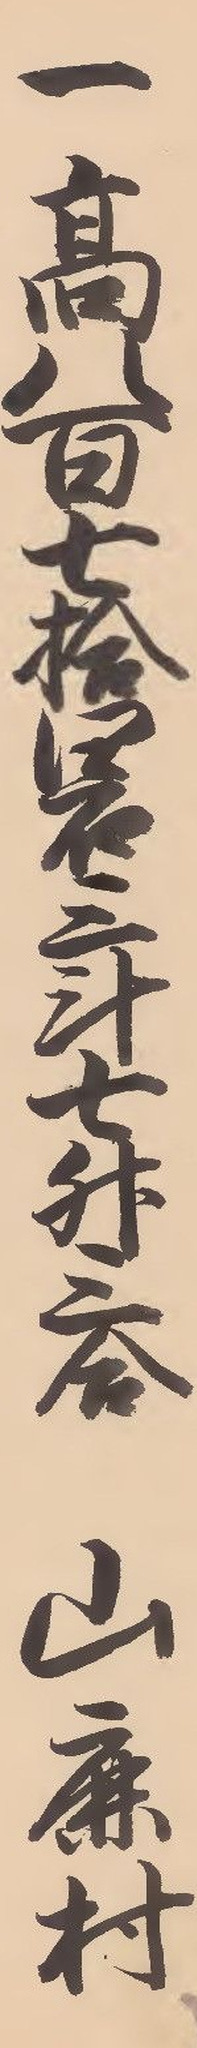一高八百七拾四石三斗七升三合山鹿村
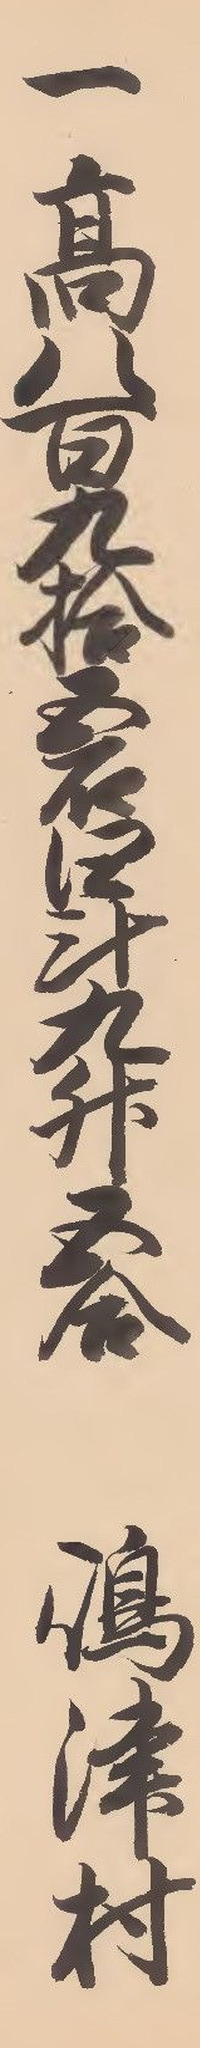一高八百九拾五石四斗九升五合島津村
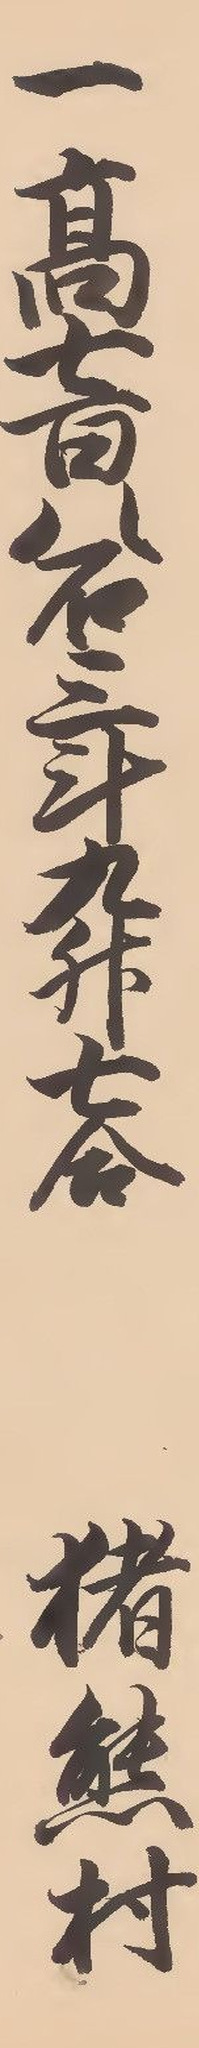一高七百八石三斗九升七合猪熊村
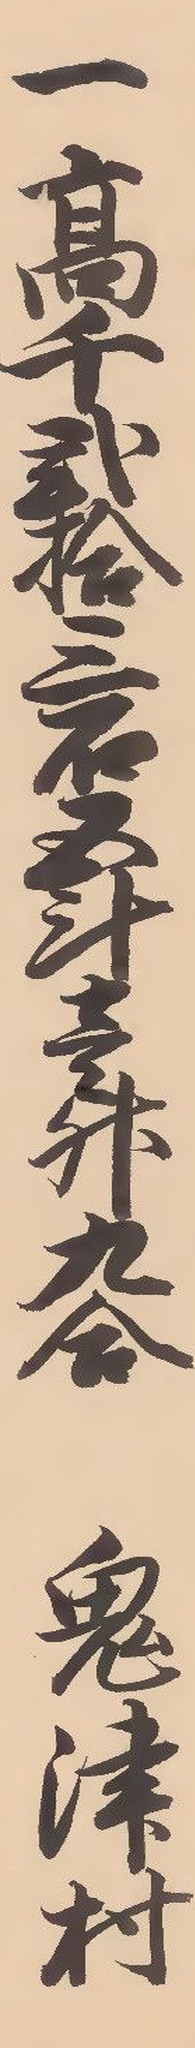一高千弐十三石五斗壱升九合鬼津村
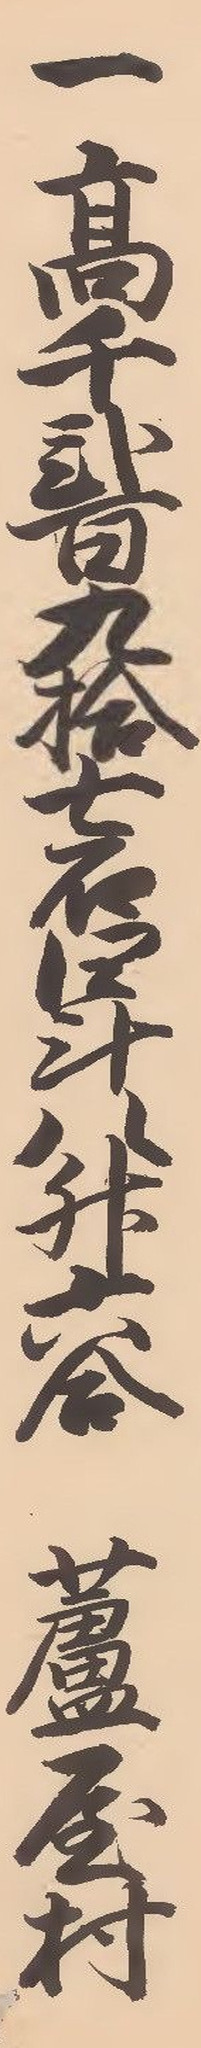一高千弐百九拾七石四斗八升六合蘆屋村

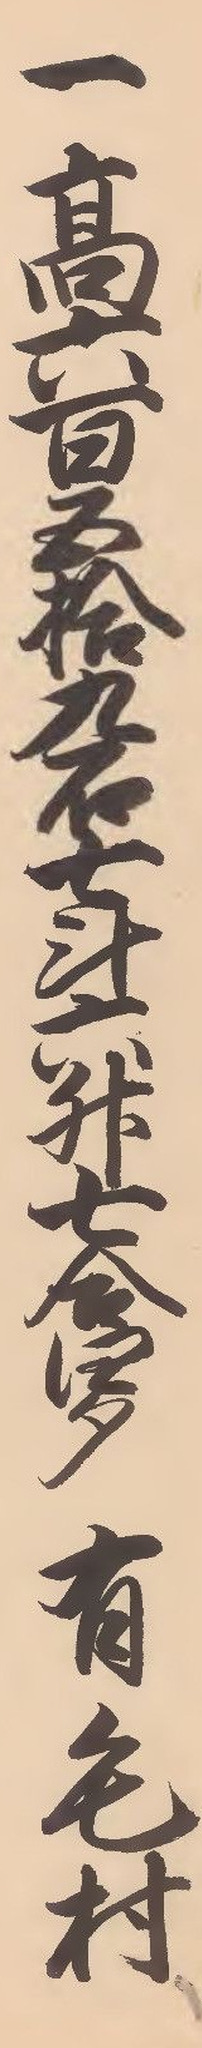一高六百五拾九石七斗六升七合四勺有毛村
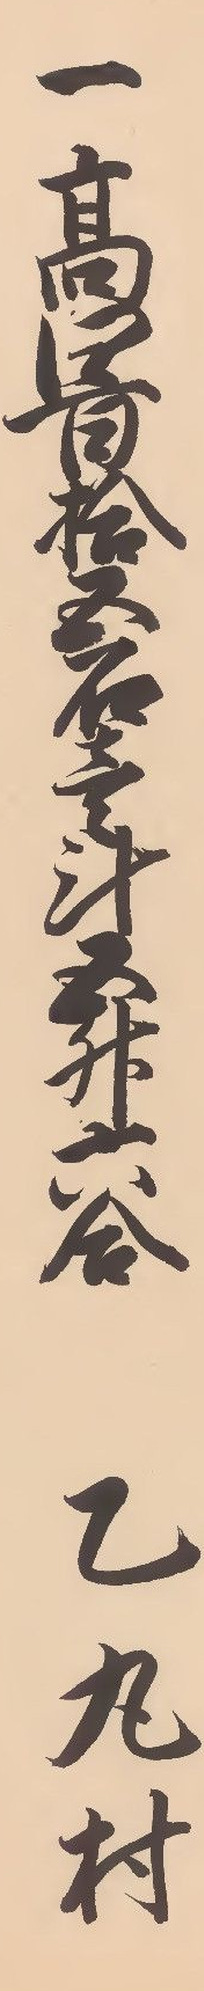一高四百拾五石壱斗五升六合乙丸村
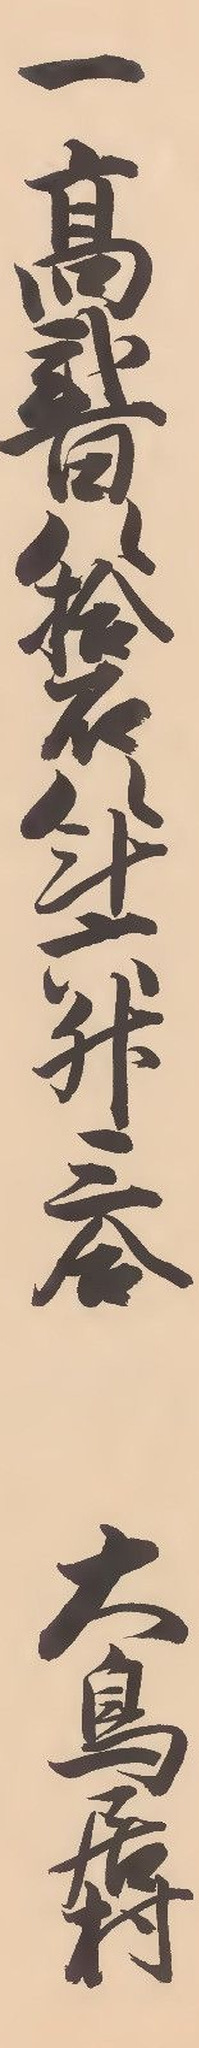一高弐百八拾石八斗六升三合大鳥居村
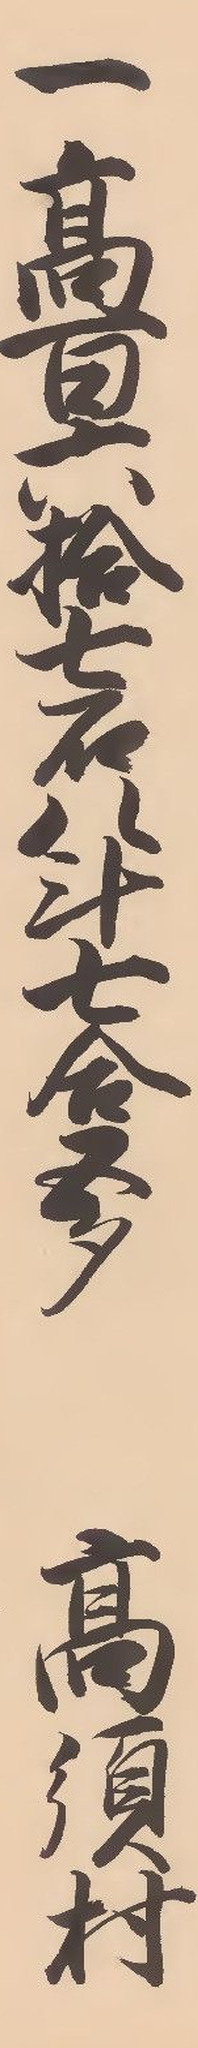一高百六拾七石八斗七合五勺高須村
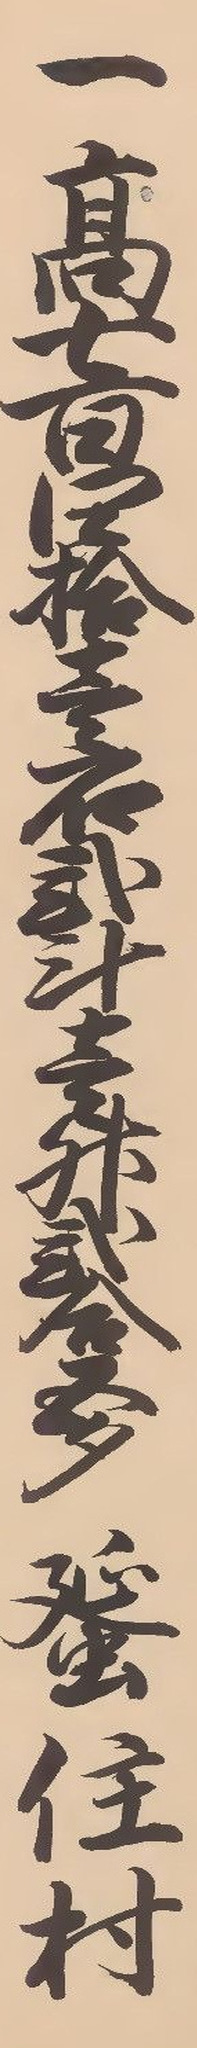一高七百四拾壱石弐斗壱升弐合五尺蜑住村
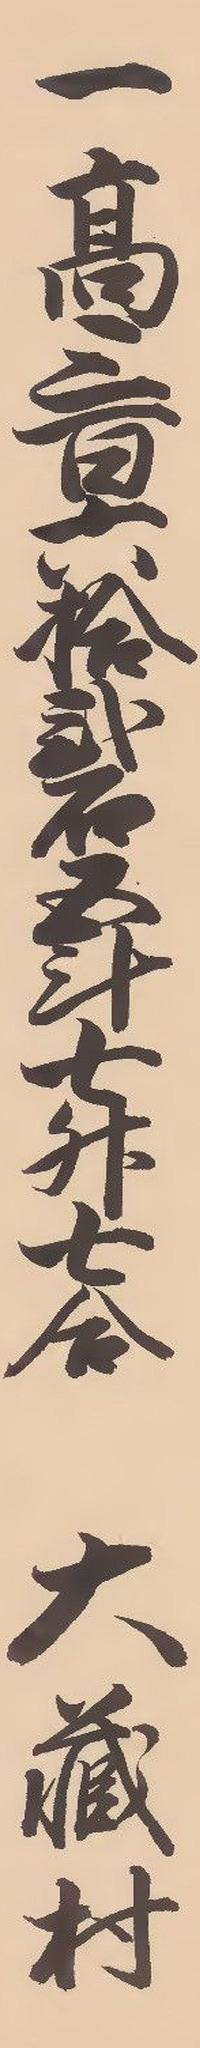一高三百六拾弐石五斗七升七合大蔵村

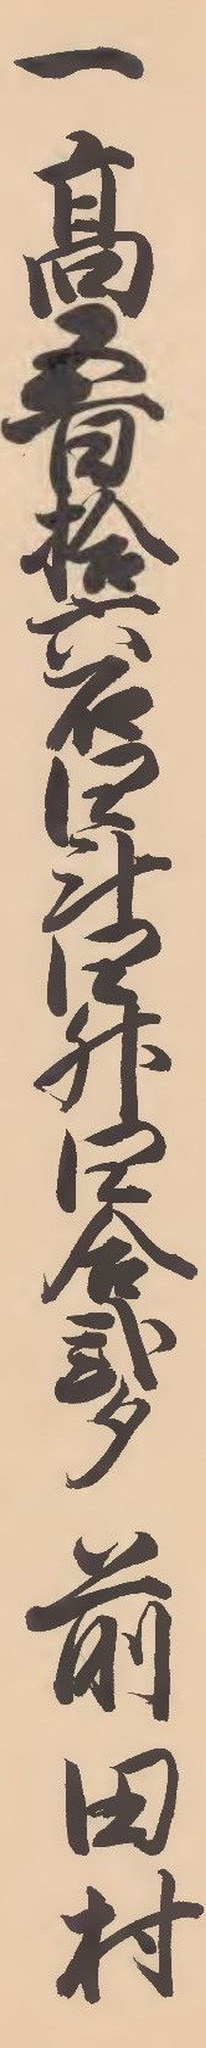一高五百拾六石四斗四升四合弐勺前田村
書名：筑前国郷帳
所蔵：国立公文書館 National Archives of Japan
